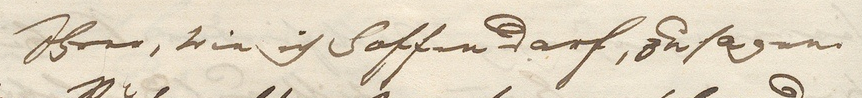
Ihrer, wie ich hoffen darf, zusagen-
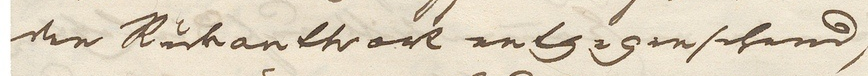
den Rückantwort entgegensehend,
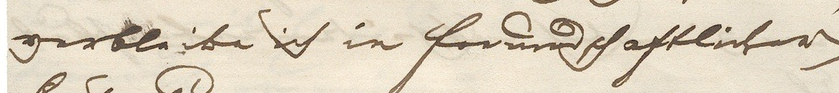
verbleibe ich in freundschaftlicher
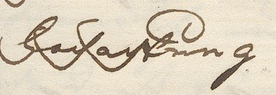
Hochachtung
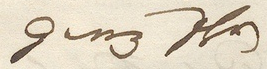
ganz Ihr.
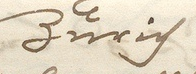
Zürich
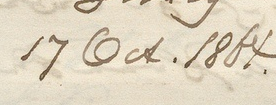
17 Oct. 1864.
